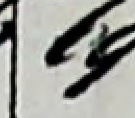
69
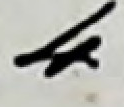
4
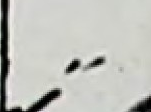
„
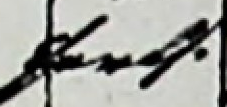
?er??
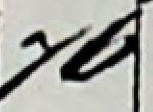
76
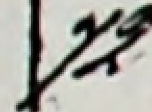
72
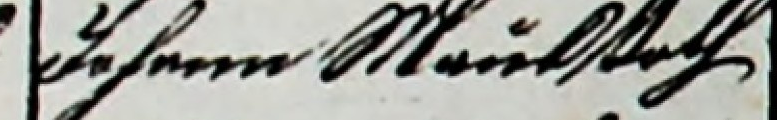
Johann Mauskoth
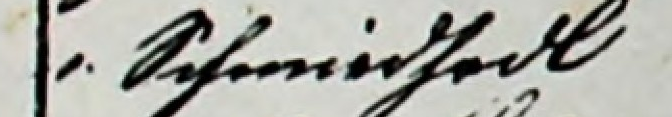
v. Schmiedhedl
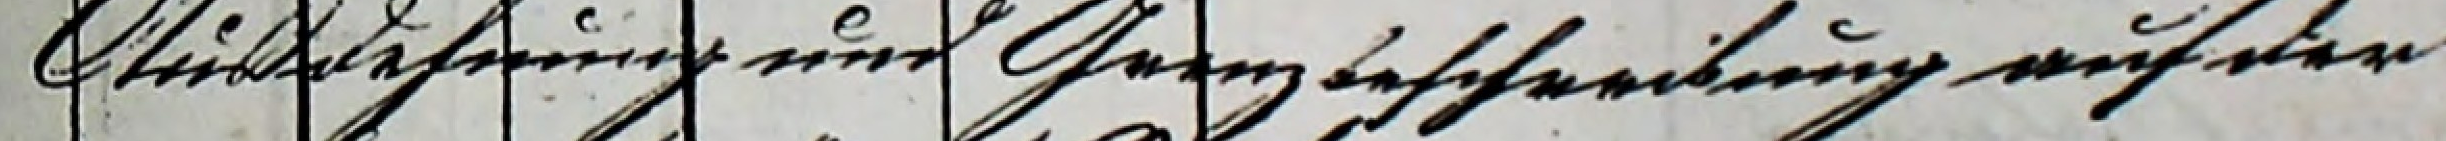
Ausdehnung und Grenz Beschreibung auf der
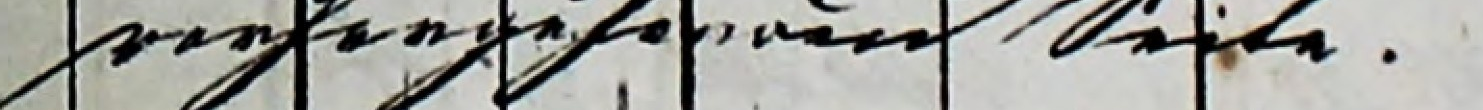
vorhergehenden Seite.
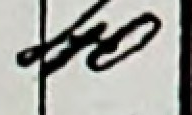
40
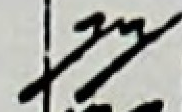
77
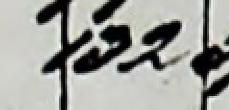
132
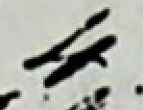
4
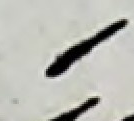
1
